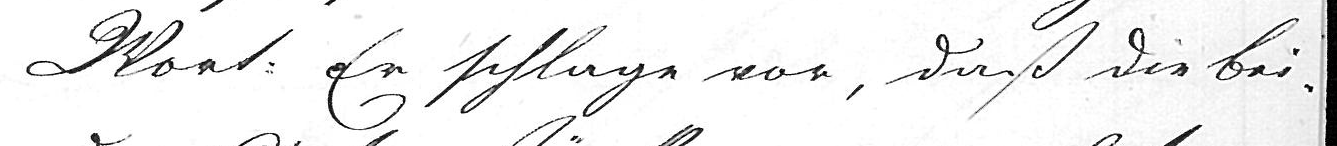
Wort: Er schlage vor, daß die bei-
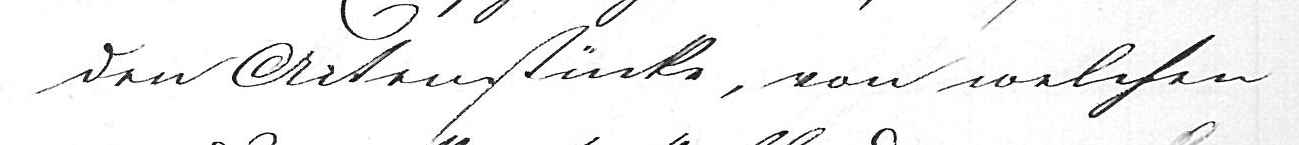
den Actenstücke, von welchen
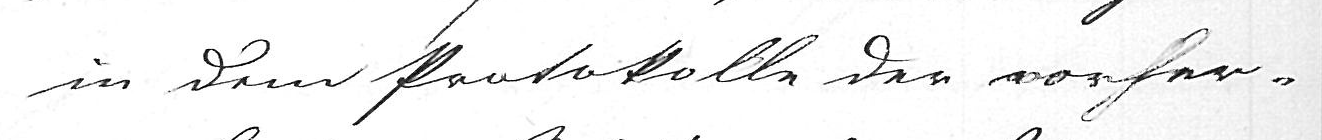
in dem Protokolle der vorher-
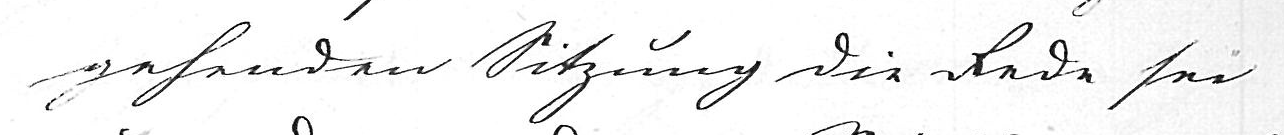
gehenden Sitzung die Rede sei
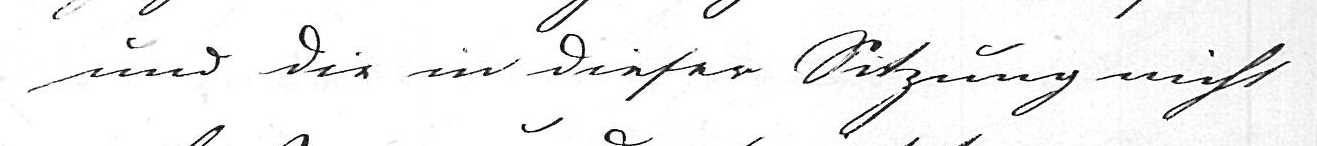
und die in dieser Sitzung nicht
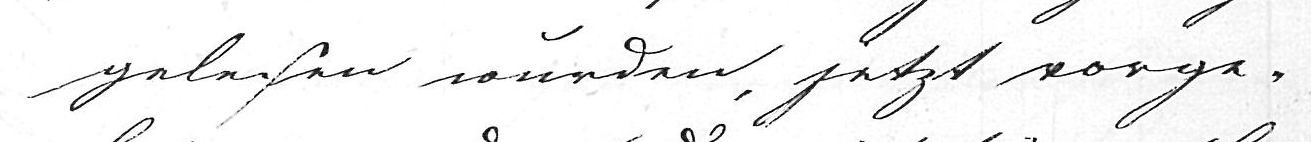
gelesen wurden, jetzt vorge-
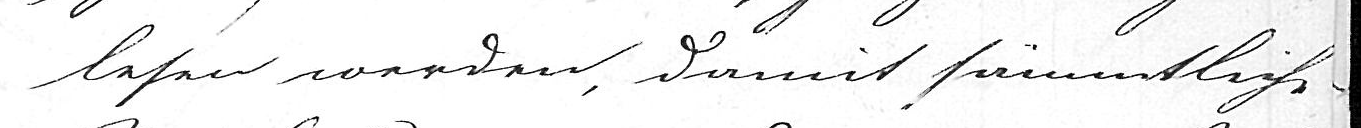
lesen werden, damit sämmtliche
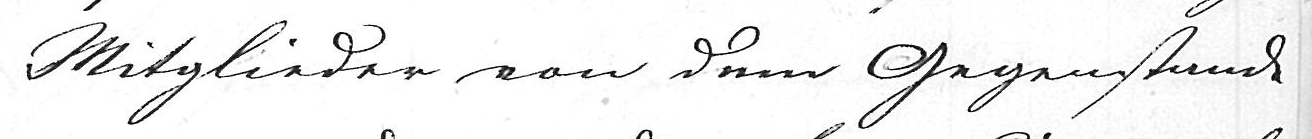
Mitglieder von dem Gegenstande
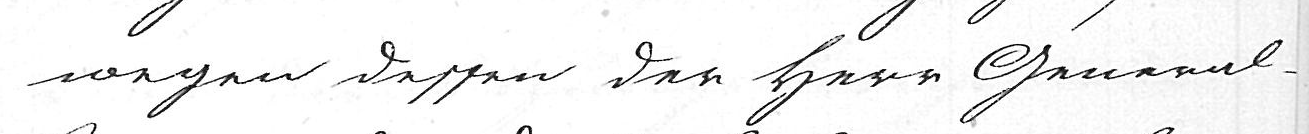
wegen dessen der Herr General-
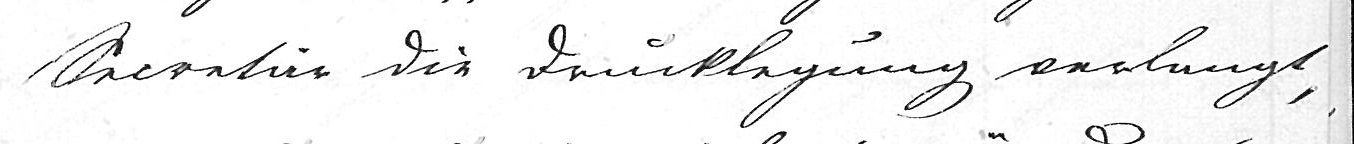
Secretär die Drucklegung verlangt,
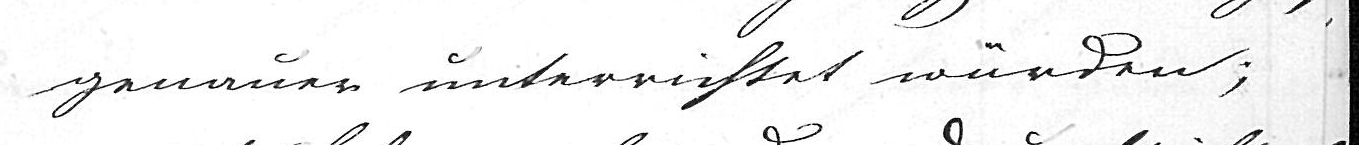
genauer unterrichtet würden;
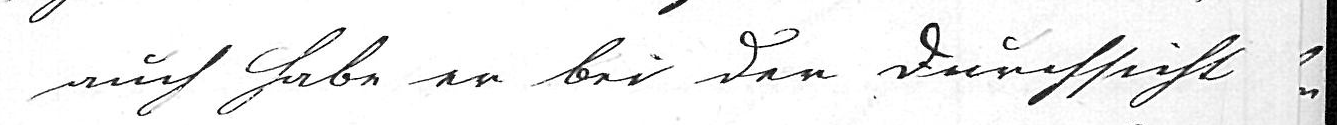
auch habe er bei der Durchsicht
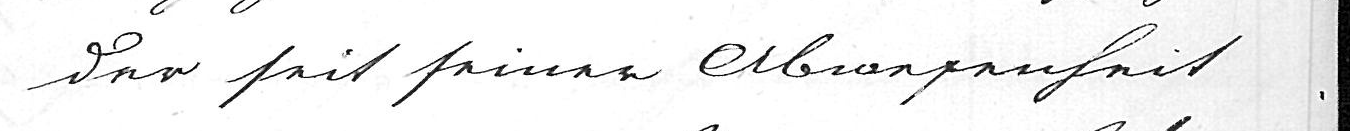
der seit seiner Abwesenheit
